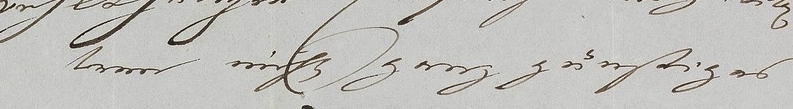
wenn nicht ganz günstiges
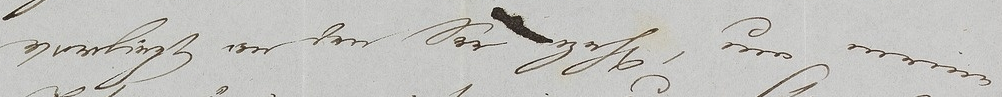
vorliegt an den See gehen, um meine
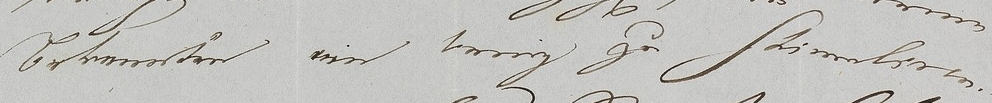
Bekannten ein wenig zu stimuliren. –
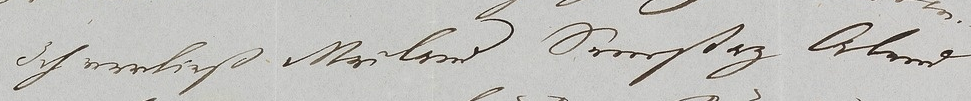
Ich verließ MailandSamstag Abend &
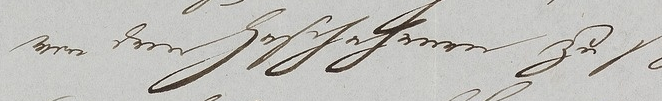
von dem Geschehenen zu
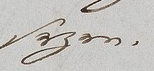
sezen.
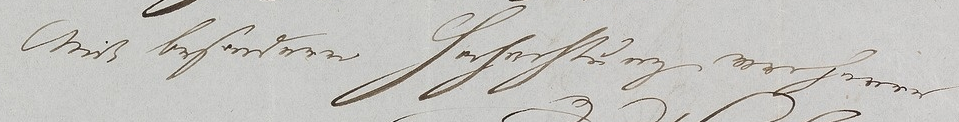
Mit besonderer Hochachtung von Herrn
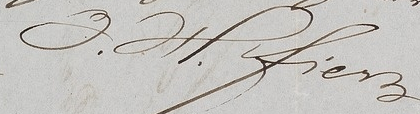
J. H. Fierz
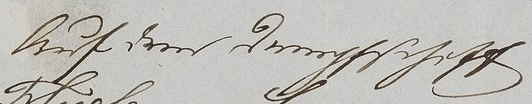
Auf dem Dampfschiff
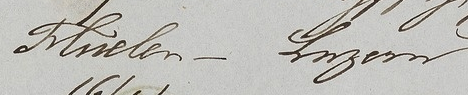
Flüelen –Luzern
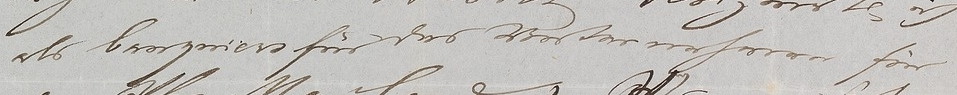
als banquiers für das Unternehmen für
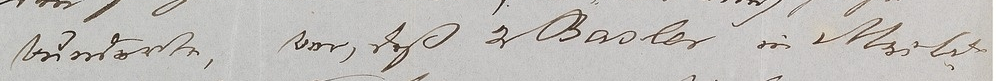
wunderte, war, daß 2 Basler in Maild
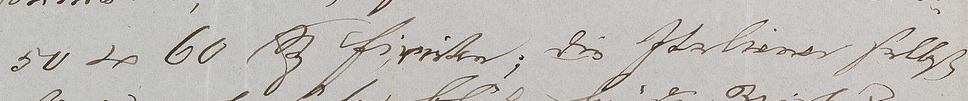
50 & 60 Stük fixirten; die Italiener selbst
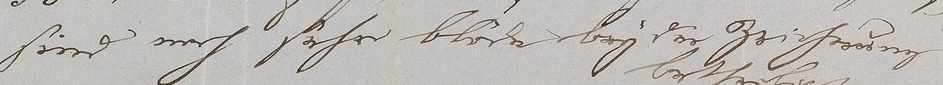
sind noch sehr blöde bey der Zeichnung
